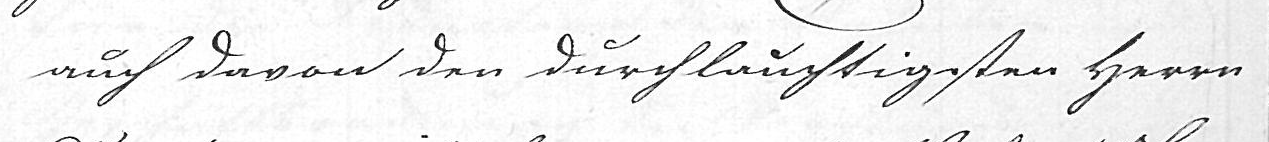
auch davon den durchlauchtigsten Herrn
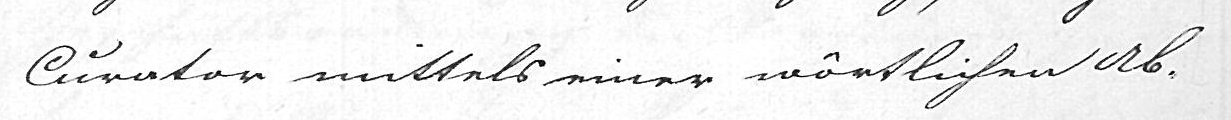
Curator mittels einer wörtlichen Ab-
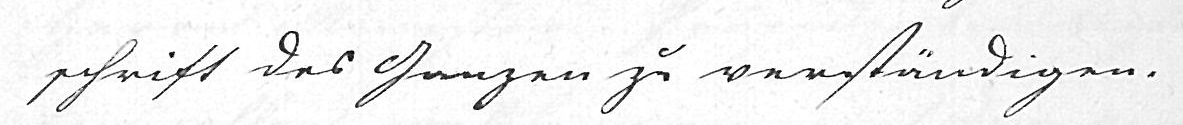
schrift des Ganzen zu verständigen.
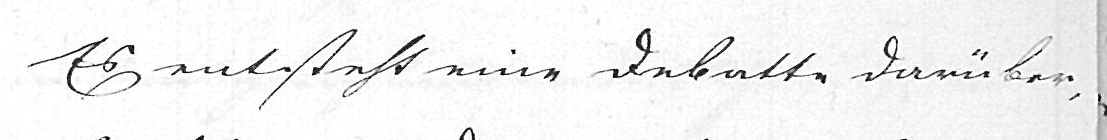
Es entsteht eine Debatte darüber,
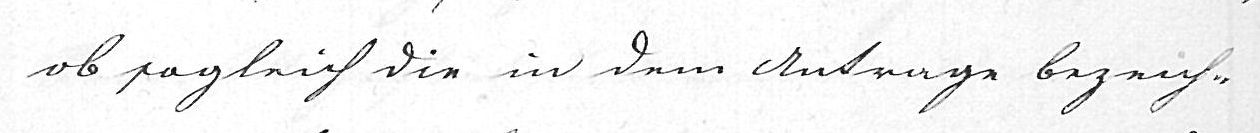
ob sogleich die in dem Antrage bezeich-
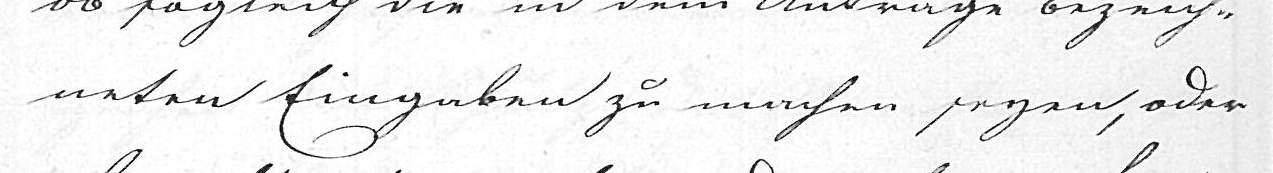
neten Eingaben zu machen seyen, oder
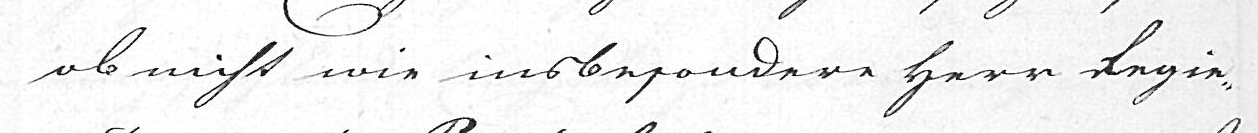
ob nicht wie insbesondere Herr Regie-
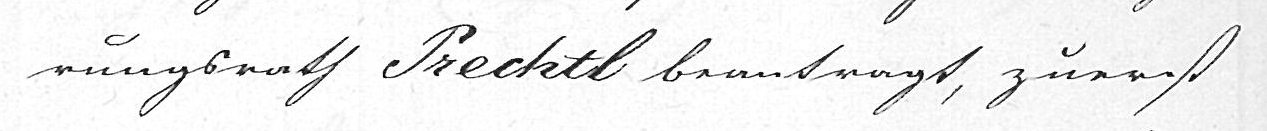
rungsrath Prechtl beantragt, zuerst
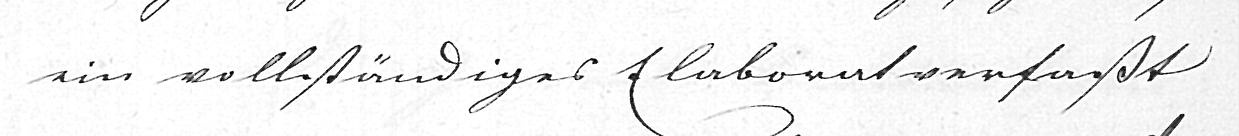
ein vollständiges Elaborat verfaßt
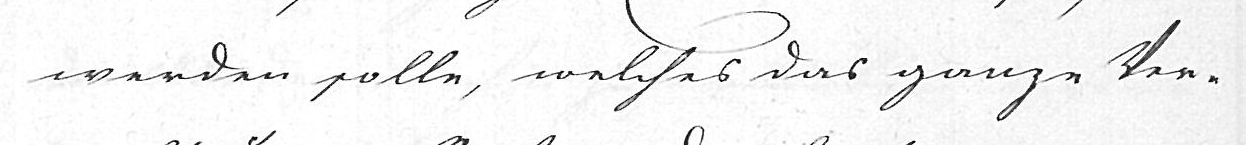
werden solle, welches das ganze Ver-
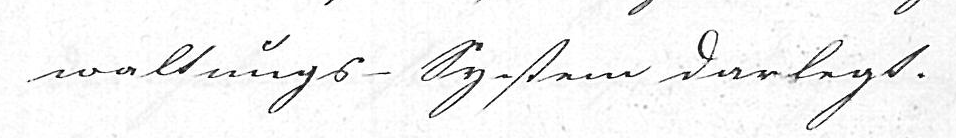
waltungs-System darlegt.
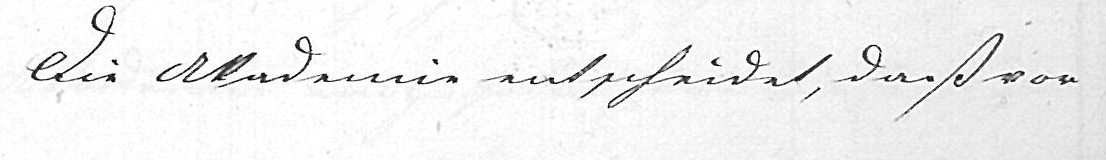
Die Akademie entscheidet, daß vor
